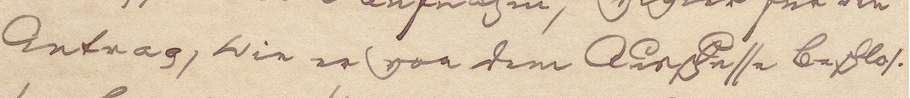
Antrag, wie er von dem Ausschusse beschlos-
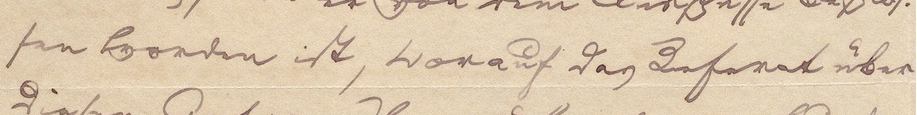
sen worden ist, worauf das Referat über
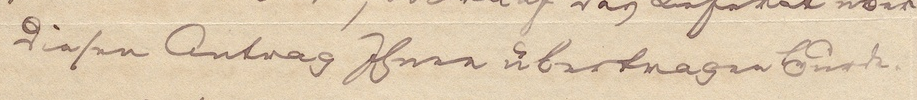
diesen Antrag Ihnen übertragen wurde.
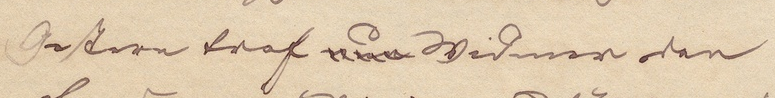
Gestern traf nunWidmer den
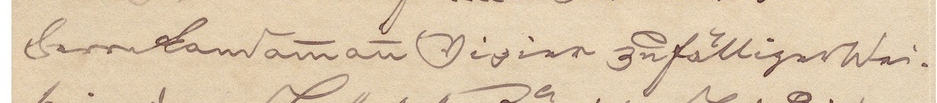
Herrn Landammann Vigier zufälliger Wei-
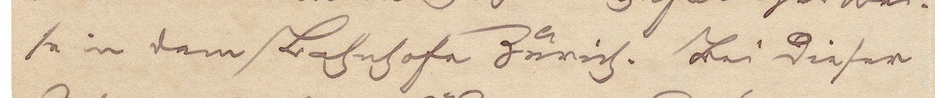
se in dem Bahnhofe Zürich. Bei dieser
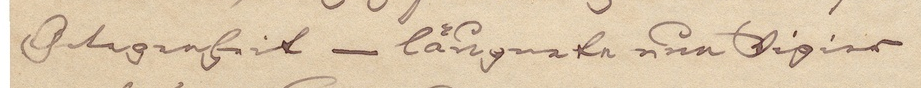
Gelegenheit – läugnete nun Vigier
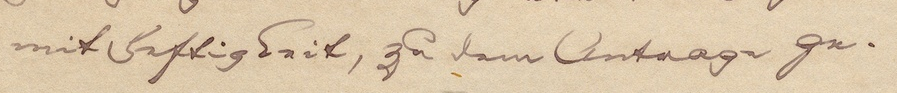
mit Heftigkeit, zu dem Antrage ge-
